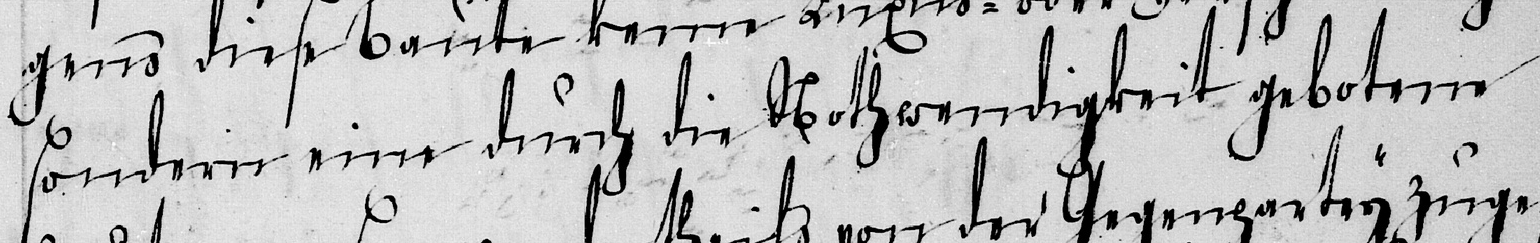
sondern eine durch die Nothwendigkeit gebotene
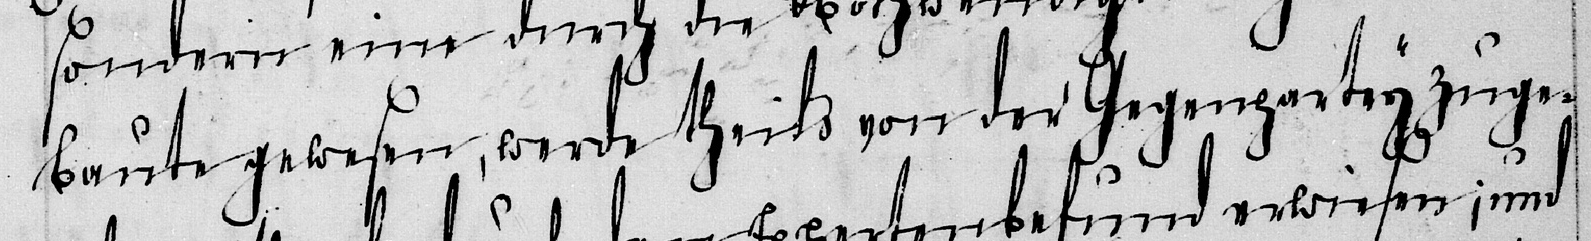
Baute gewesen, wurde theils von der Gegenpartey zuge¬
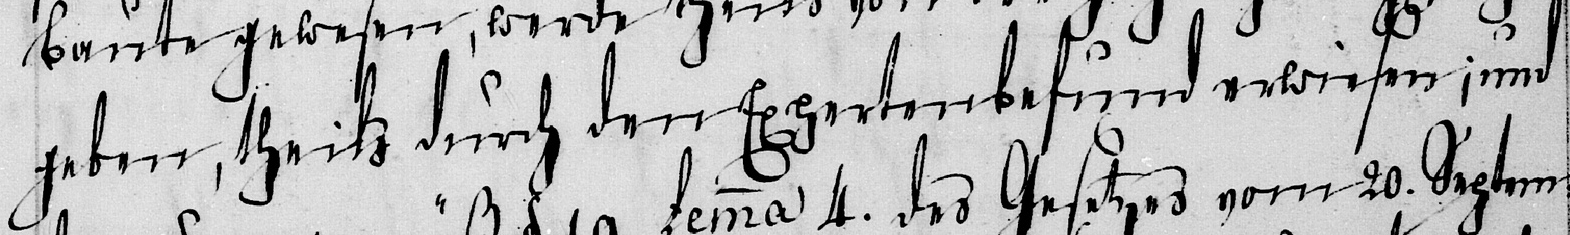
geben, theils durch den Expertenbefund erwiesen; und
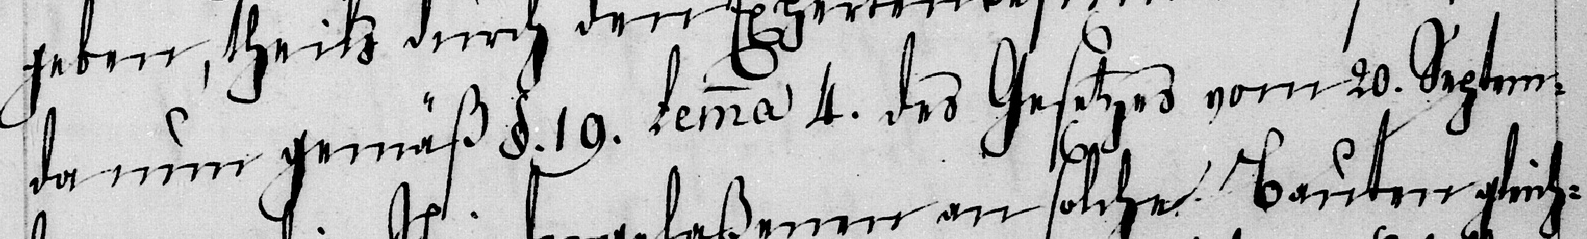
da nun gemäß §. 19. Lemma 4. des Gesetzes vom 20. Septem¬
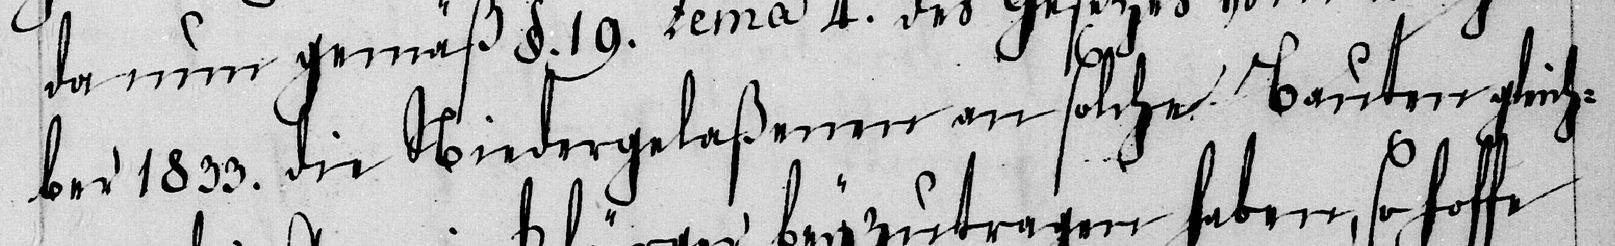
ber 1833. die Niedergelaßenen an solche Bauten gleich¬
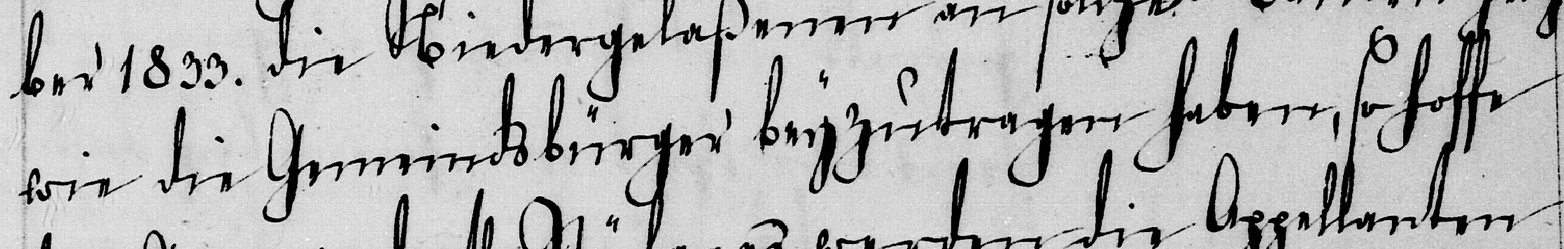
wie die Gemeindsbürger beyzutragen haben, so hoffe
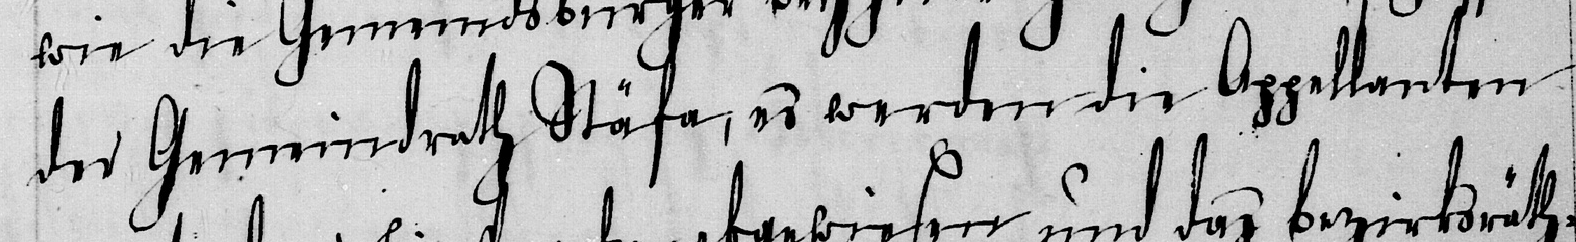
der Gemeindrath Stäfa, es werden die Appellanten
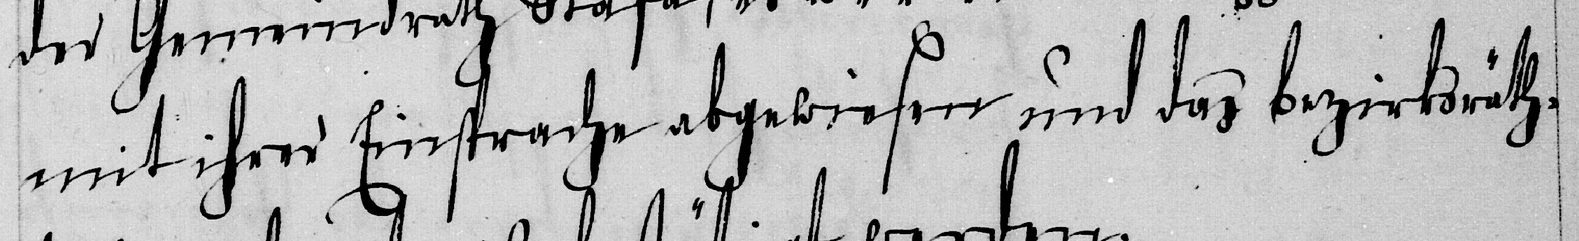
mit ihrer Einsprache abgewiesen und das bezirksräth¬
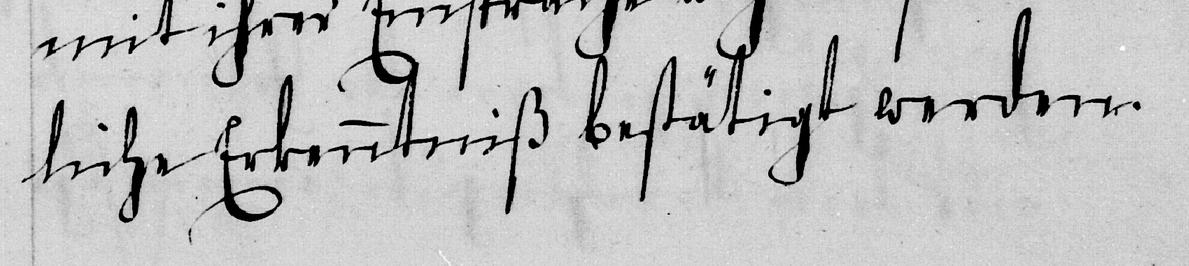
liche Erkenntniß bestätigt werden.
